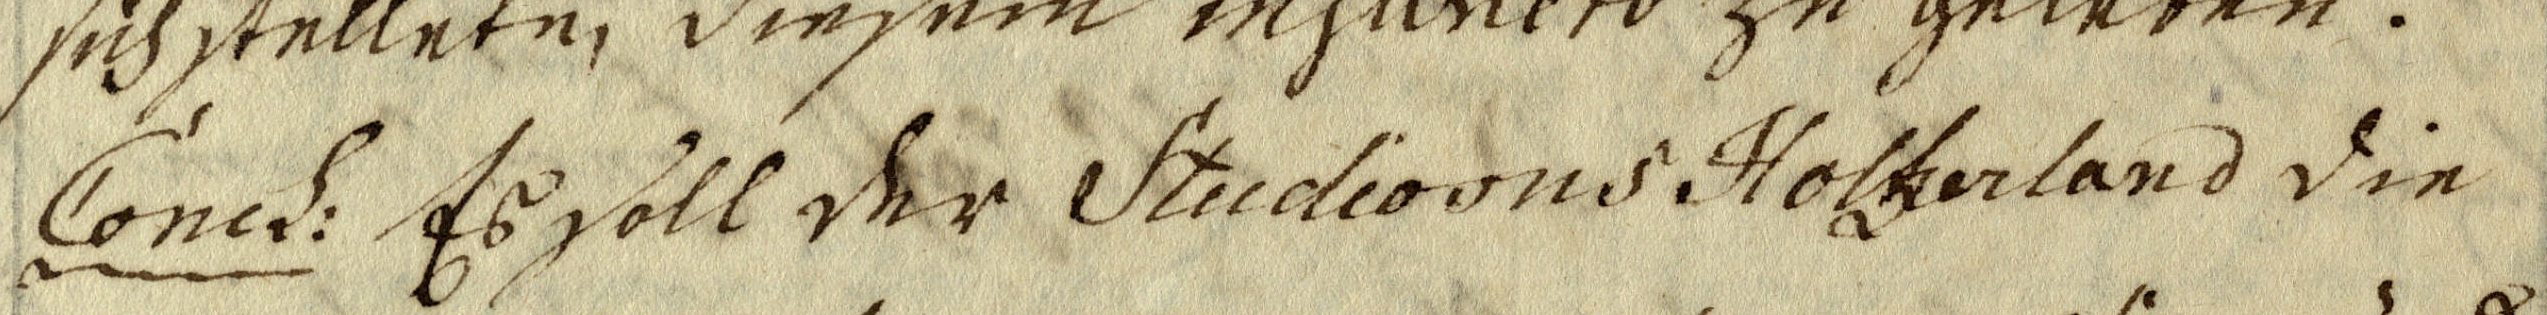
Concl. Es soll der Studiosus Holtzerland die
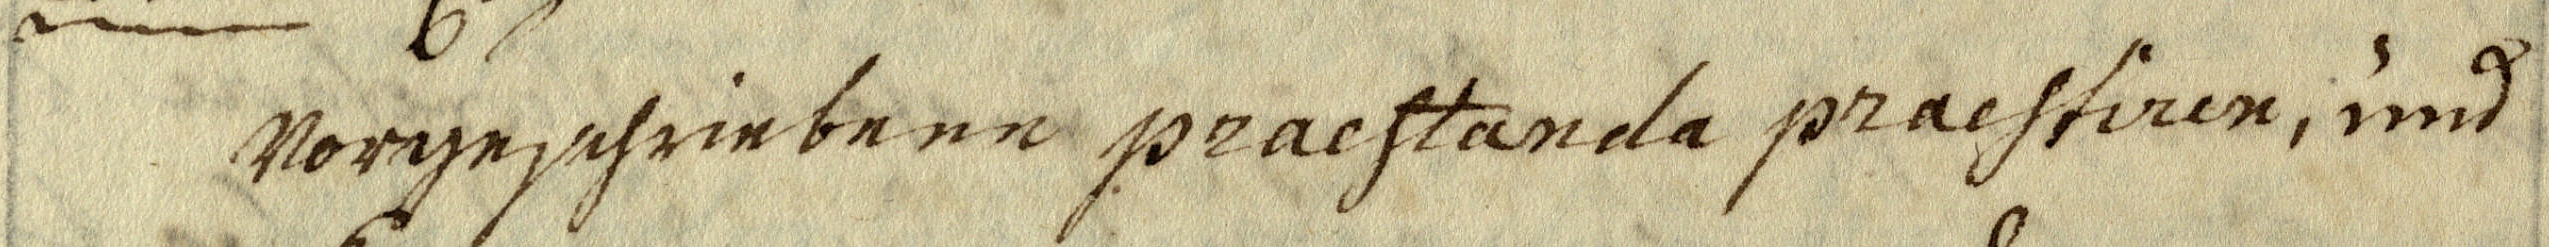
vorgeschrieben praestanda praestiren, und
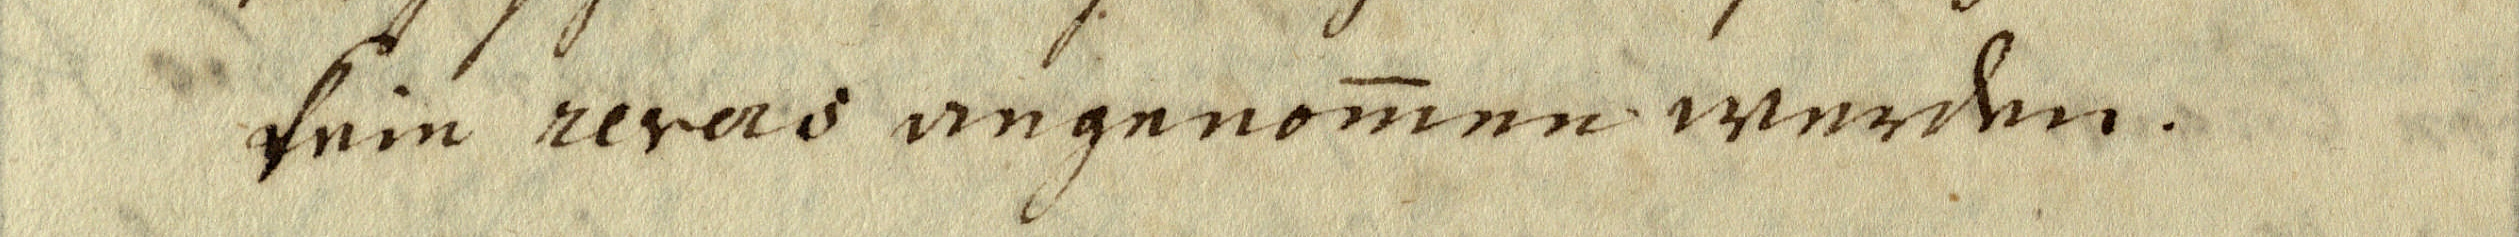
kein revers angenomen werden.
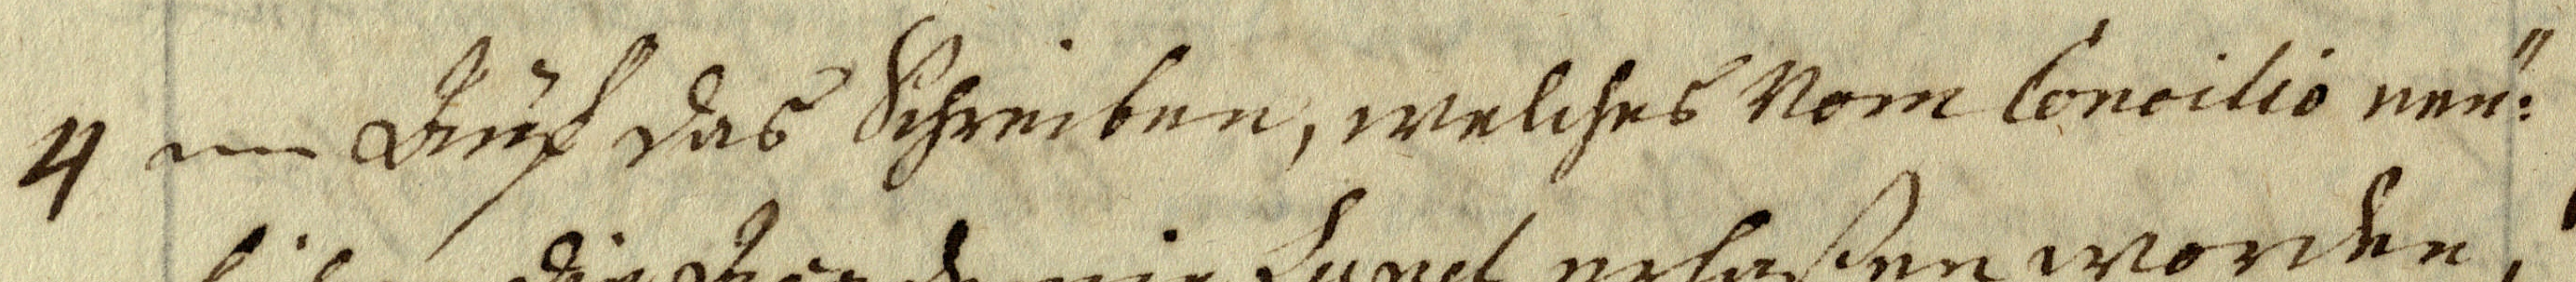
4 Auf das Schreiben, welches vom Concilio neu¬
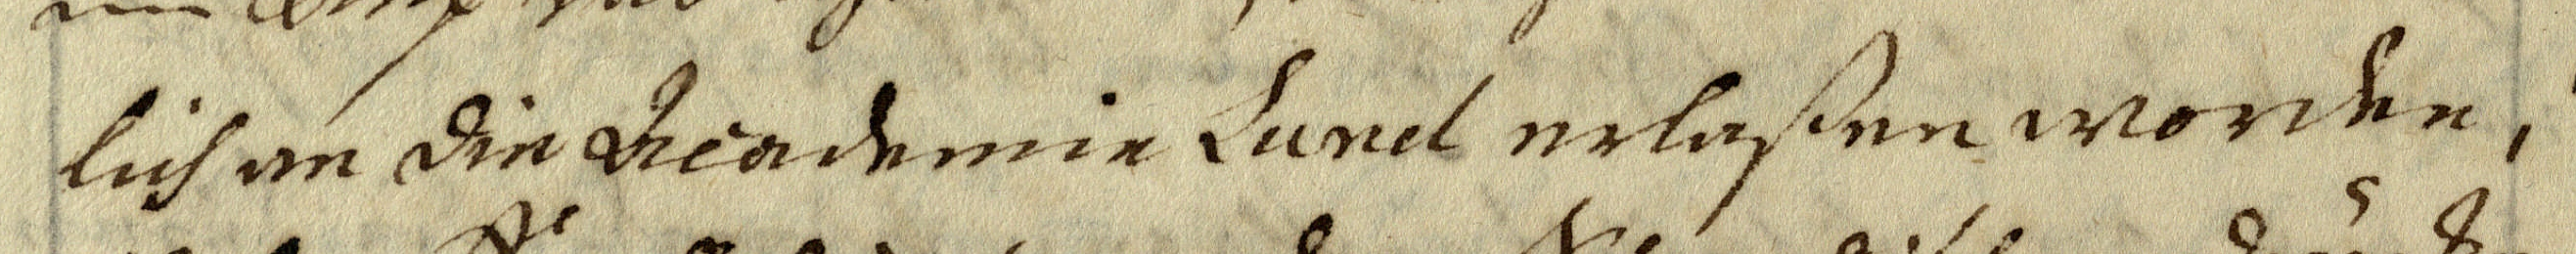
lich an die Academie Lund erlaßen worden,
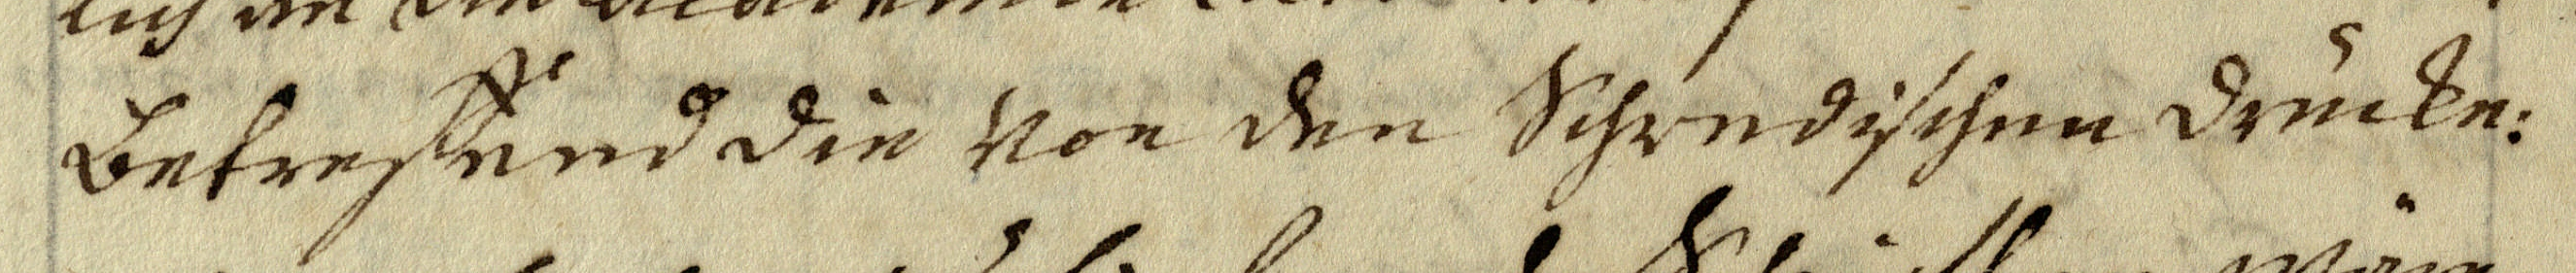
Betreffend die von den Schwedischen Drucke¬
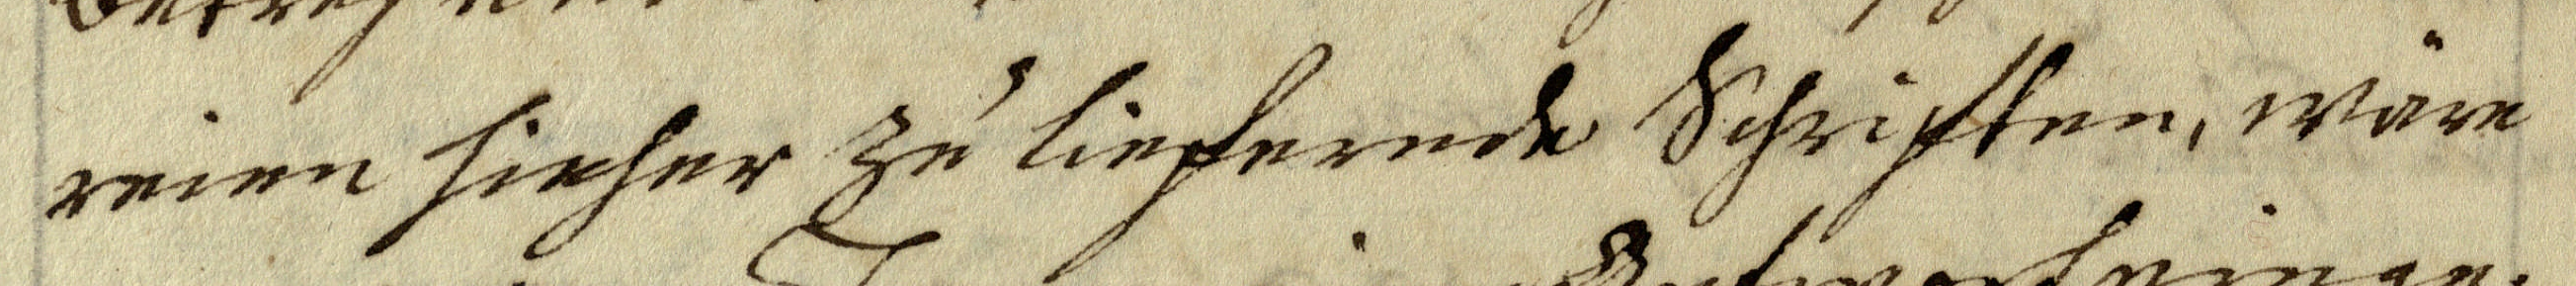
reien hieher zuliefernde Schriften,wäre
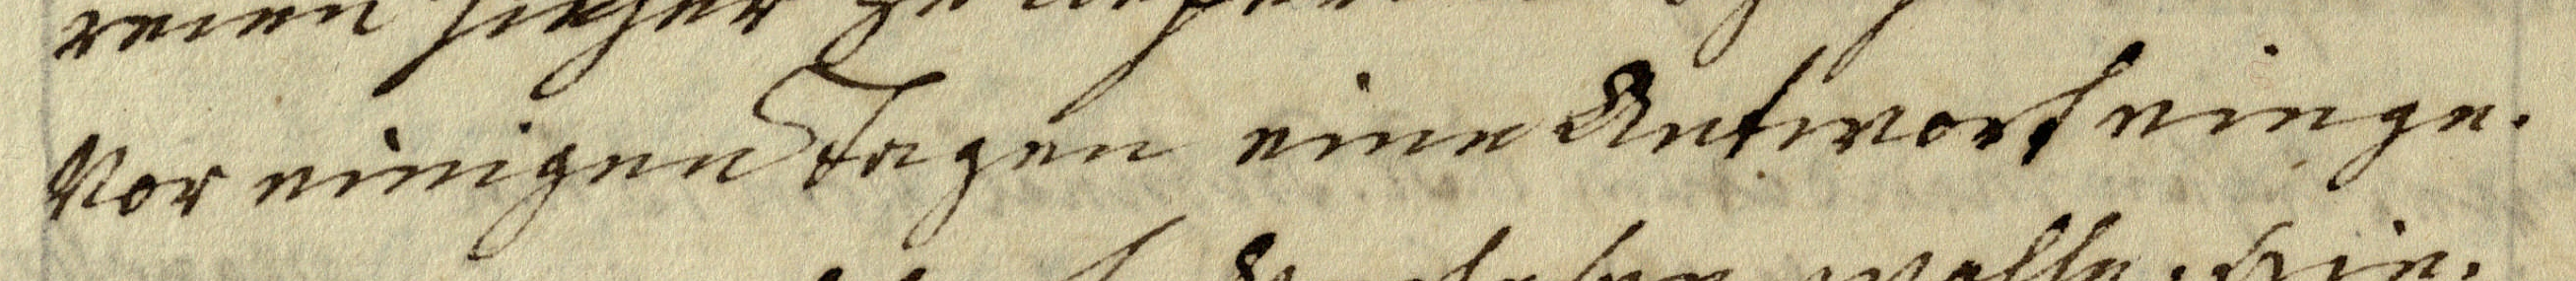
vor einigen Tagen eine Antwort einge¬
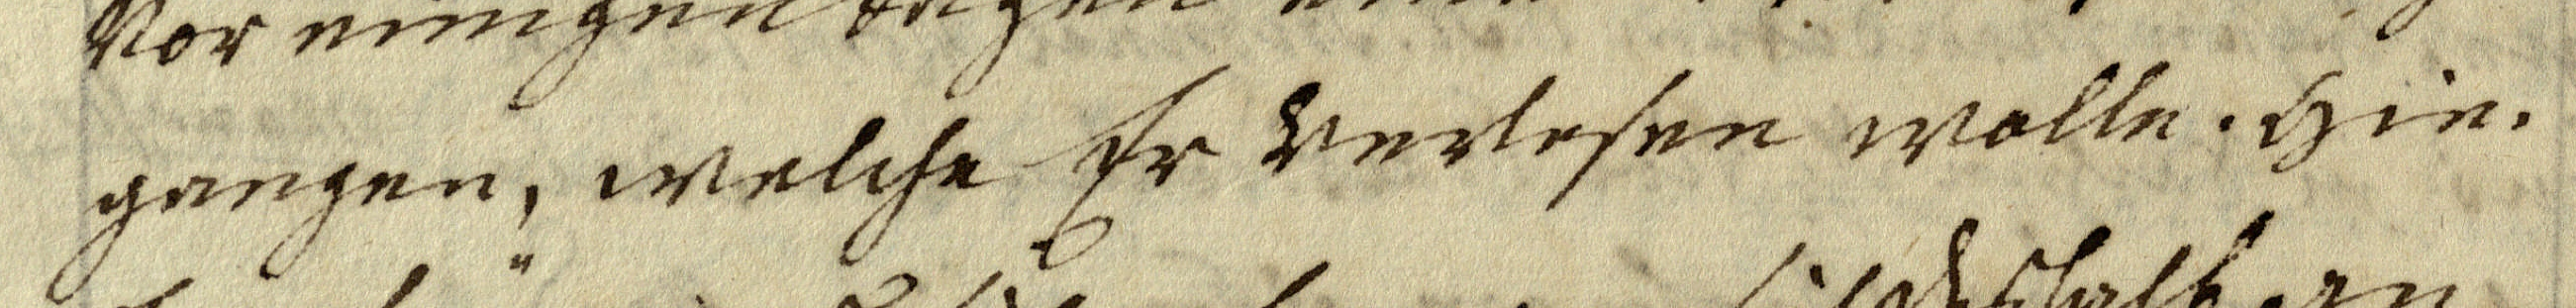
gangen, welche Er verlesen wolle. Hie¬
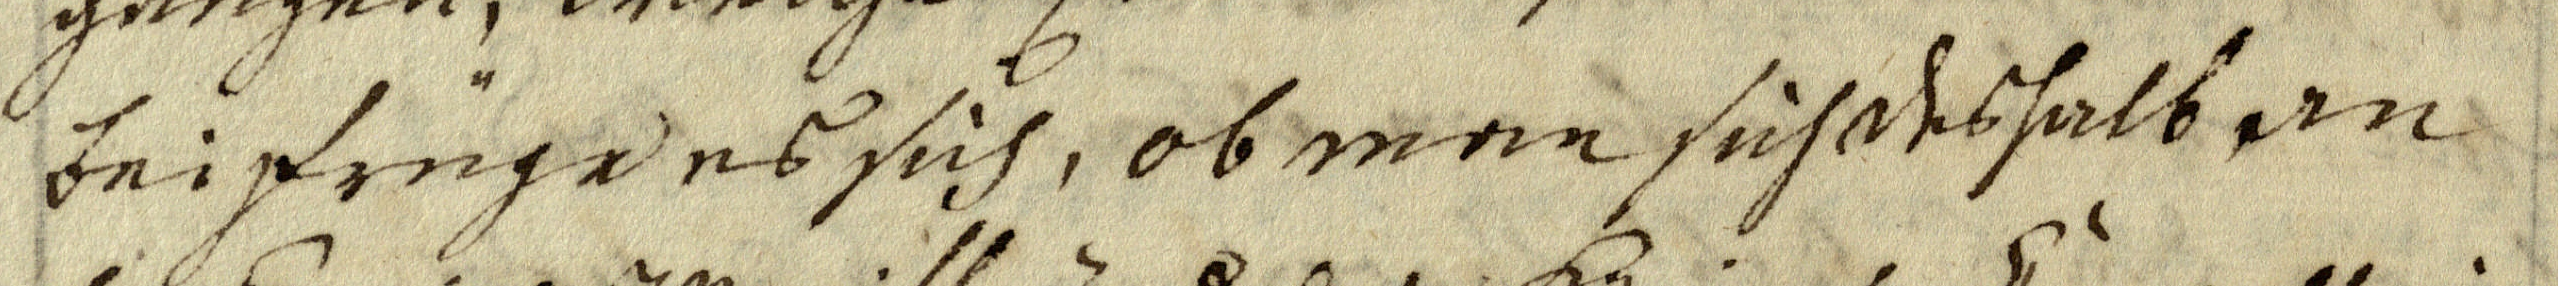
bei früge es sich, ob man sich deshalb an
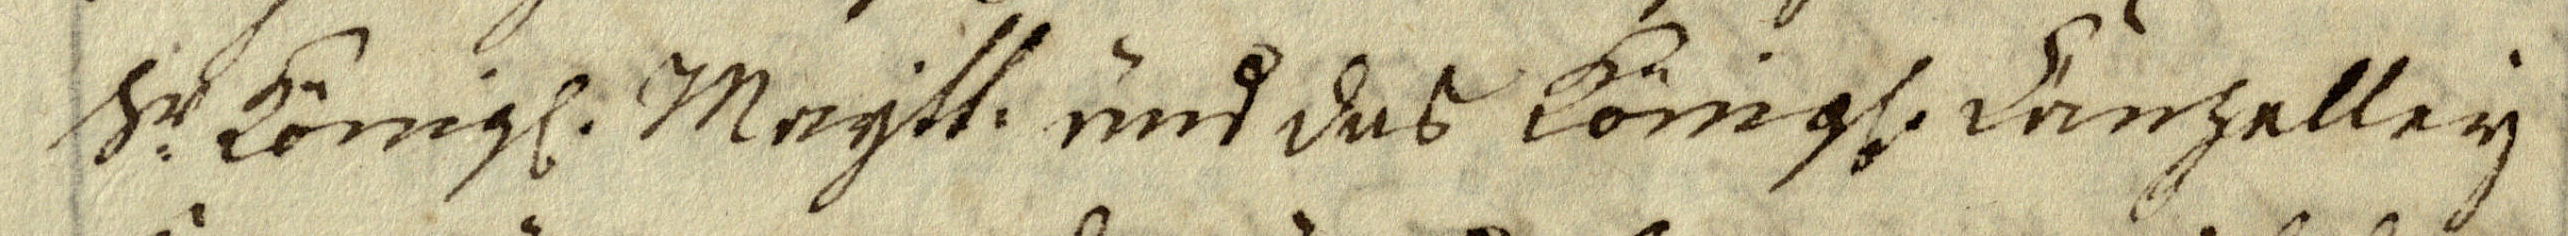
Sr. Königl. Maÿtt. und das Königl. Canzelleÿ
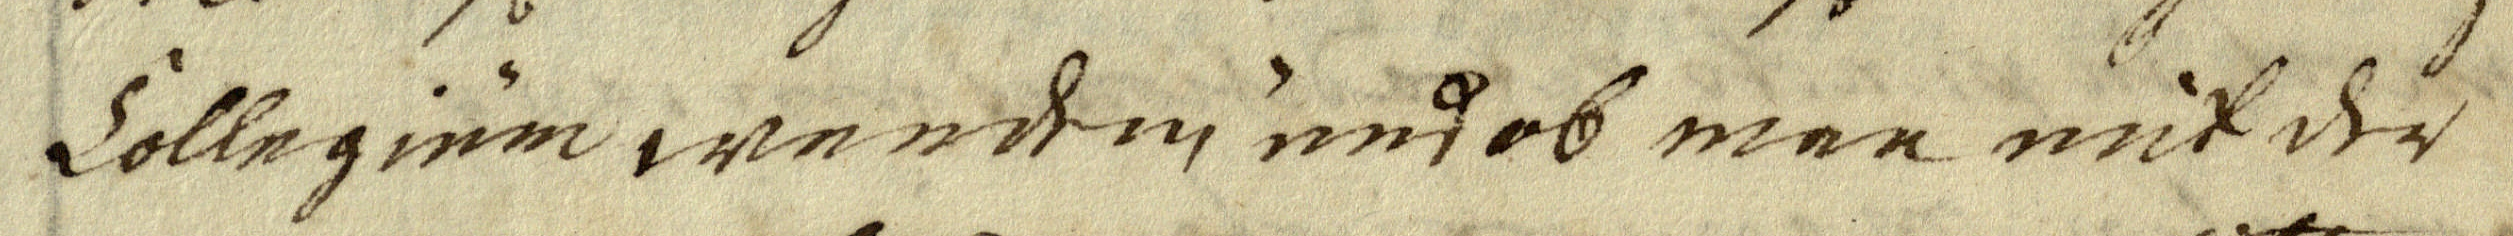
Collegium wenden, und ob man mit der
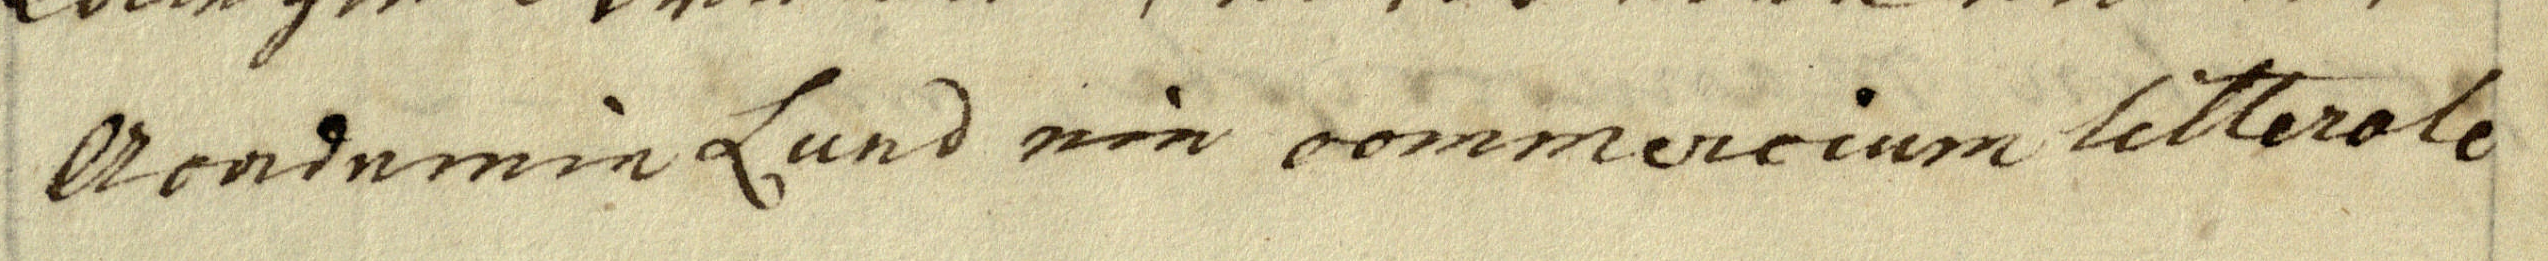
Academie Lund ein commercium litterale
